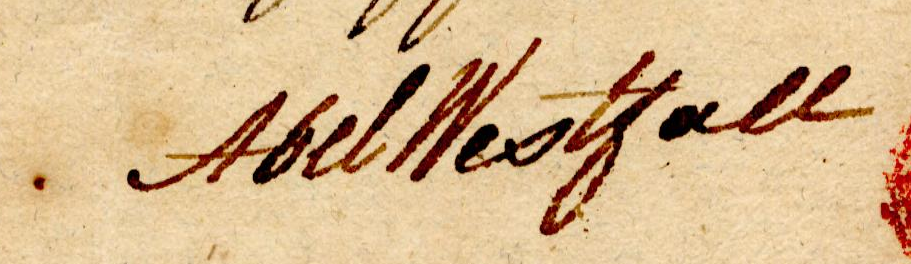Abel Westfall
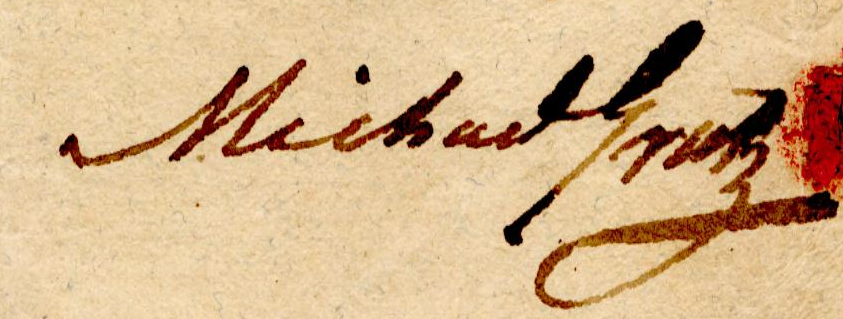Michael Gratz
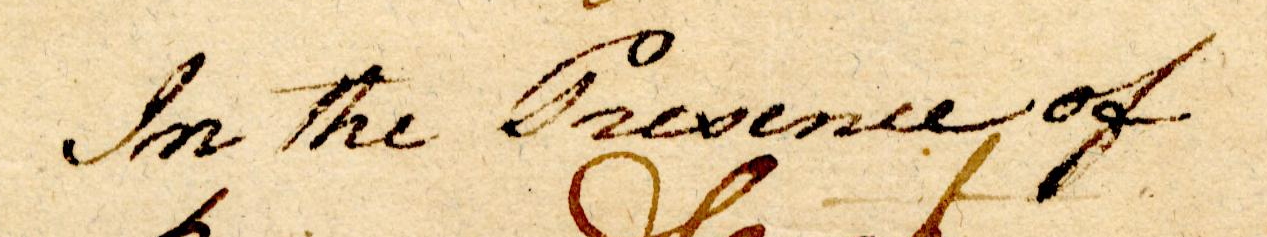In the Presence, of
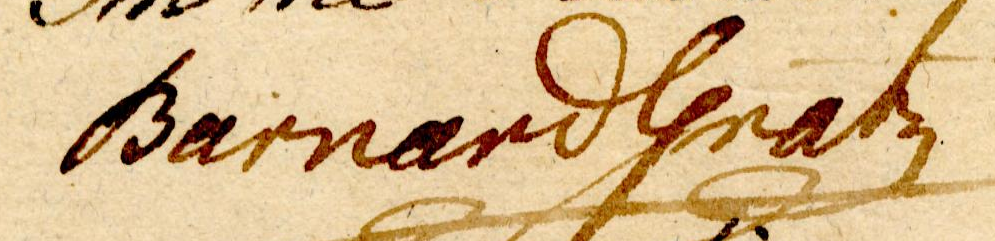Barnard Gratz
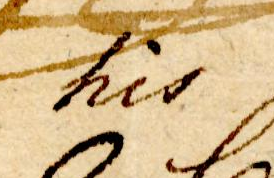his
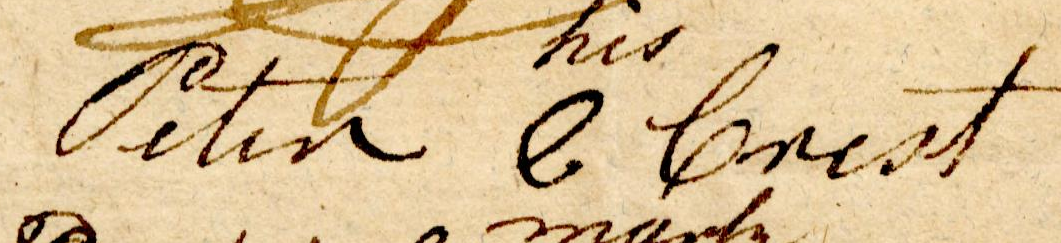Peter L Crest
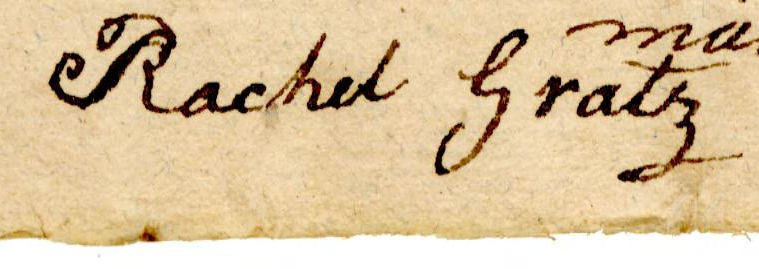Rachel Gratz
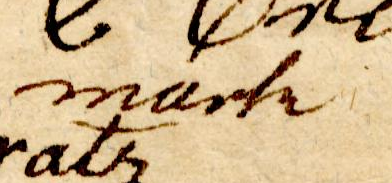mark
